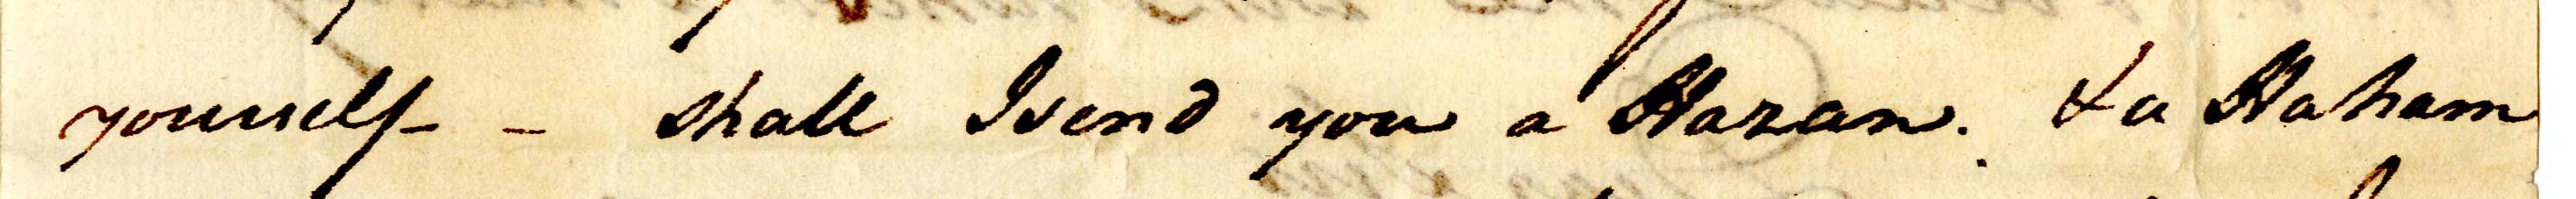yourself.- shall I send you a Haran. & a Raham
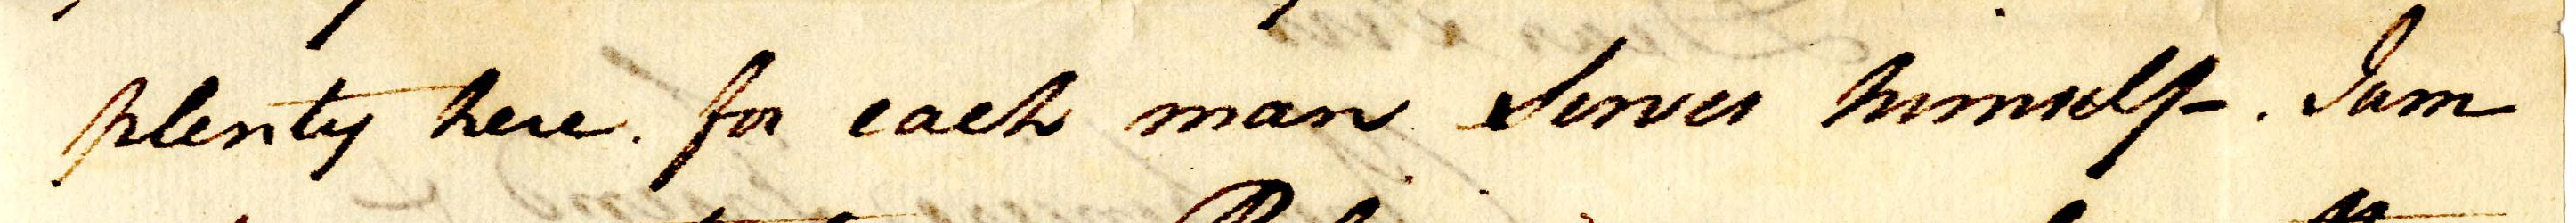plenty here for each man serves himself. I am
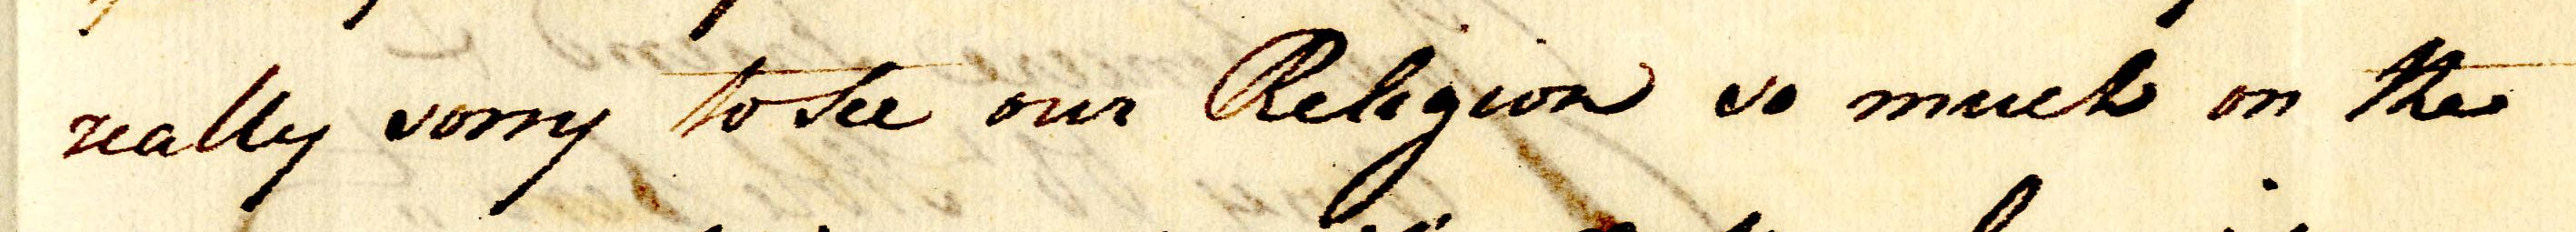really sorry to see our Religion so much on the
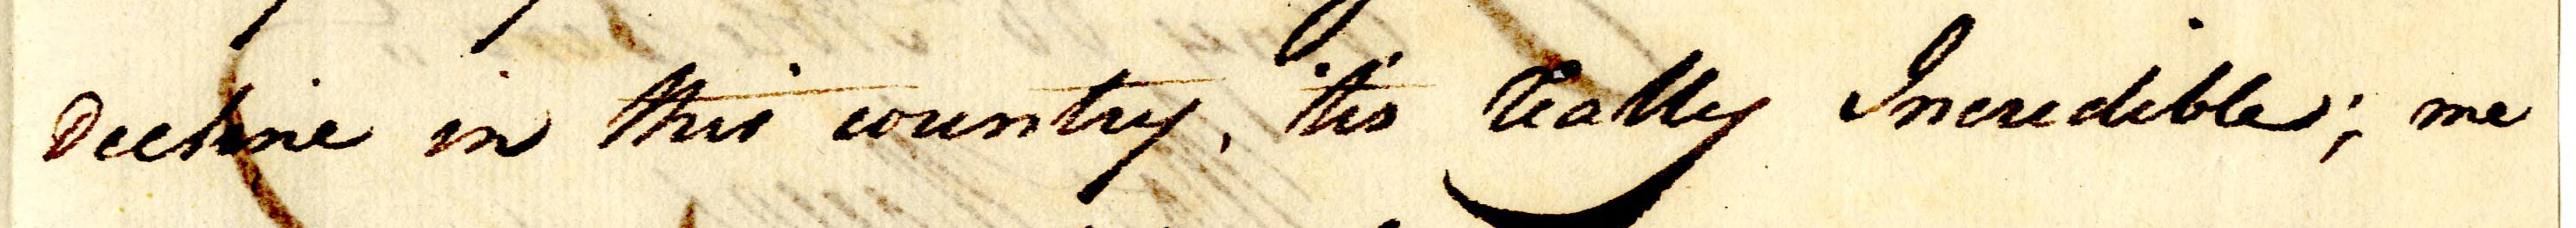decline in this county, 'tis really Incredible; me
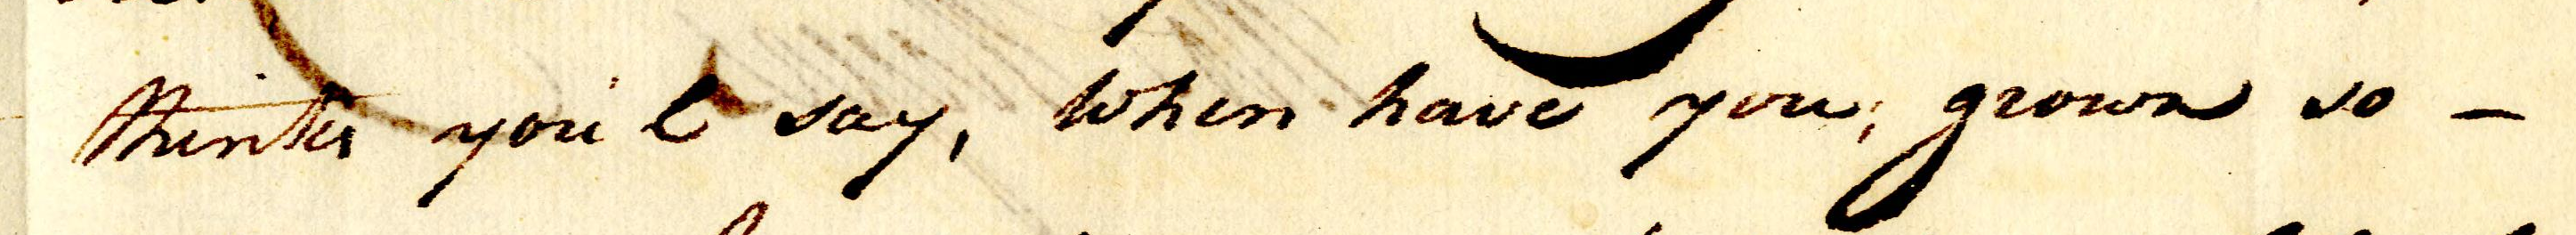thinks you'l say, when have you, grown so.-
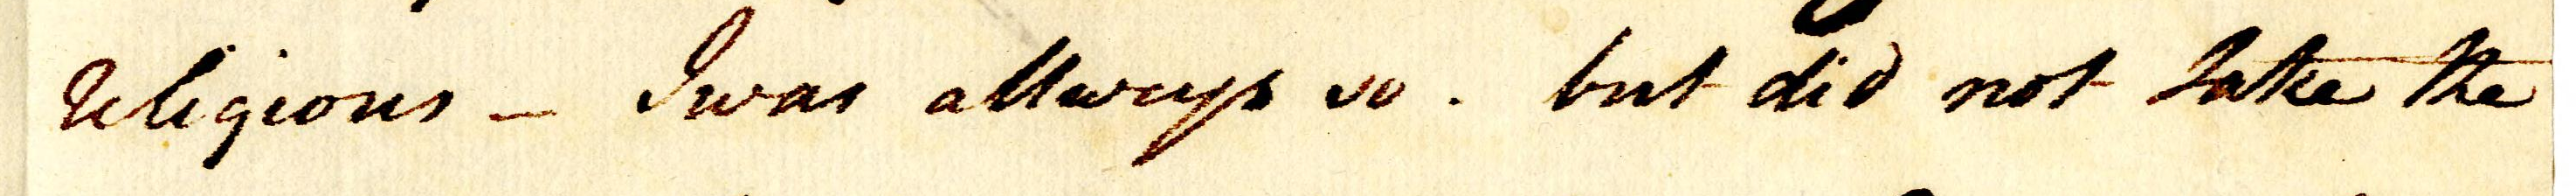religious- I was allways so. but did not take the
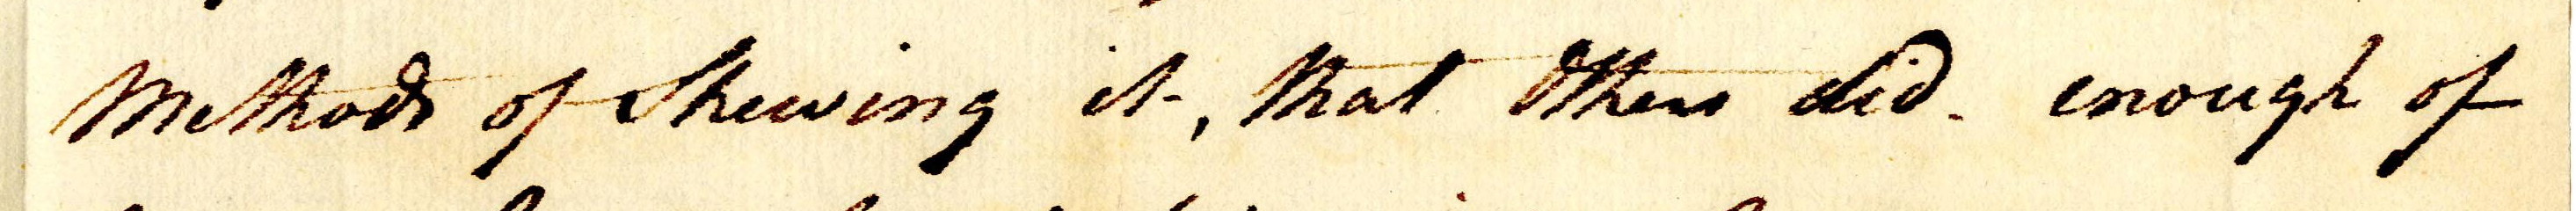method of shewing it, that those did. enough of
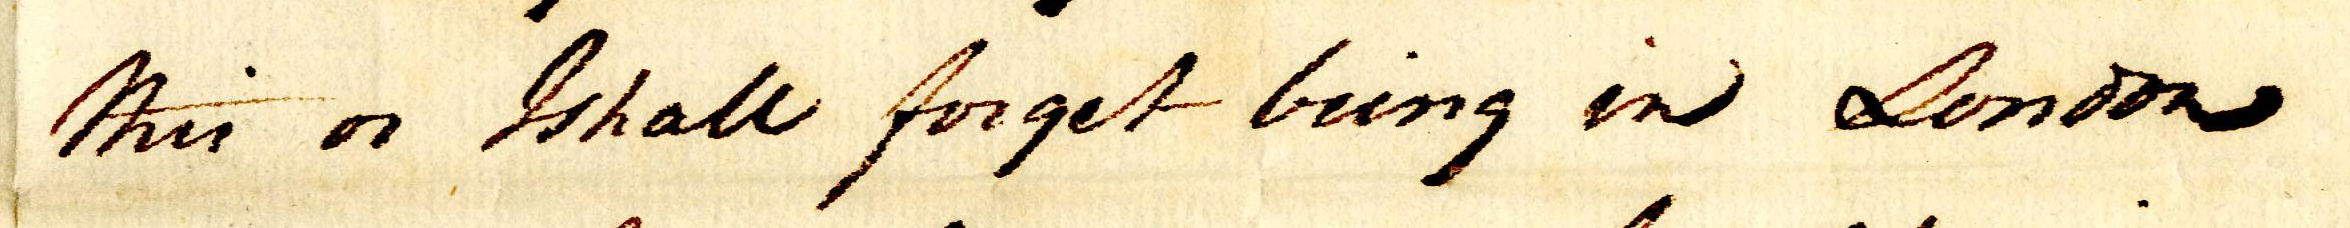this or I shall forget being in London
